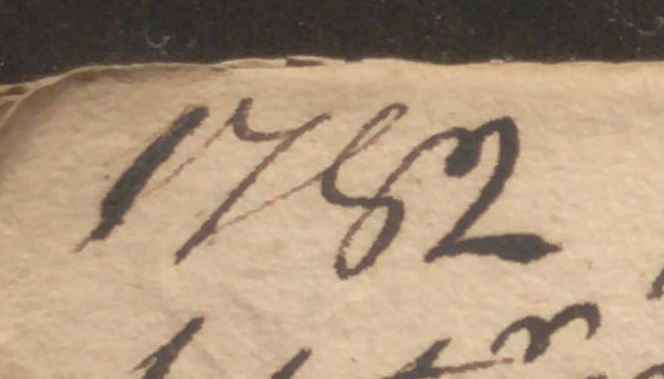1782
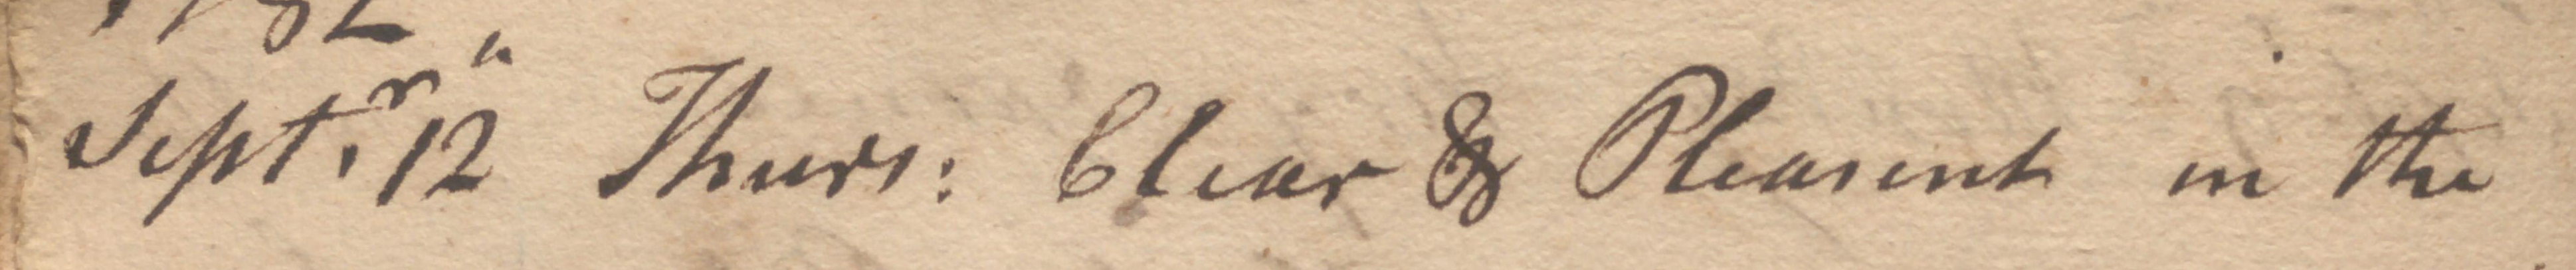Sept^r. 12 Thurs. Clear & Pleasent in the
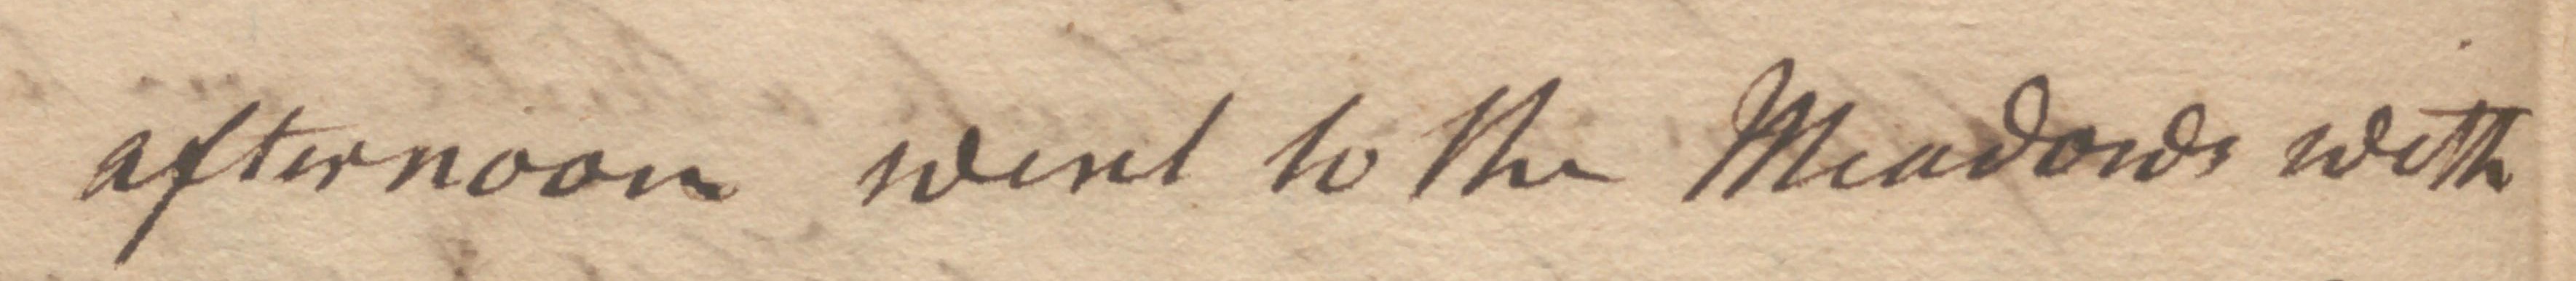afternoon went to the Meadows with
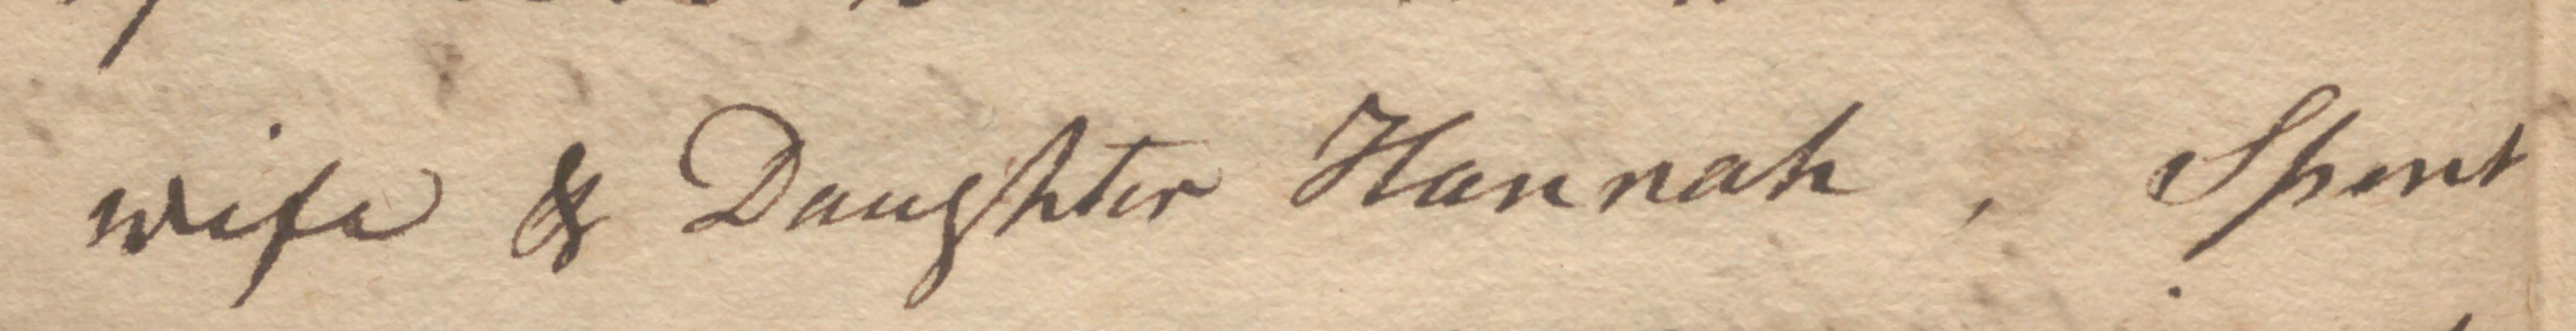wife & Daughter Hannah, Spent
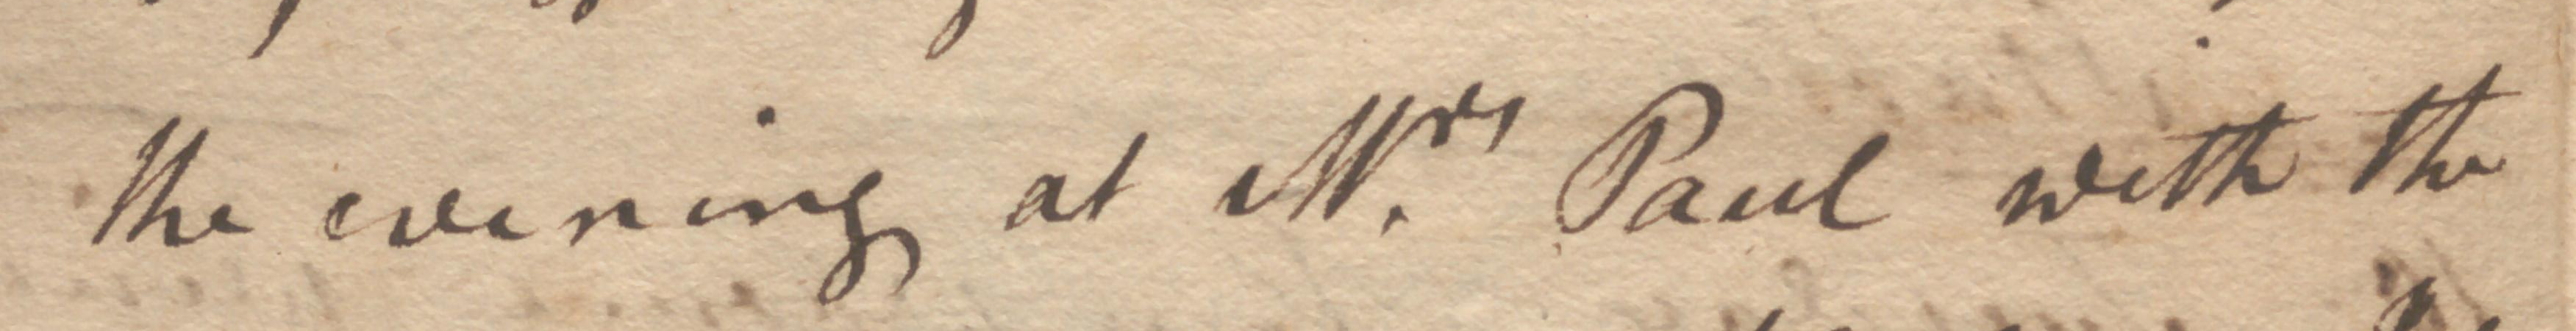the evening at M^rs. Paul with the
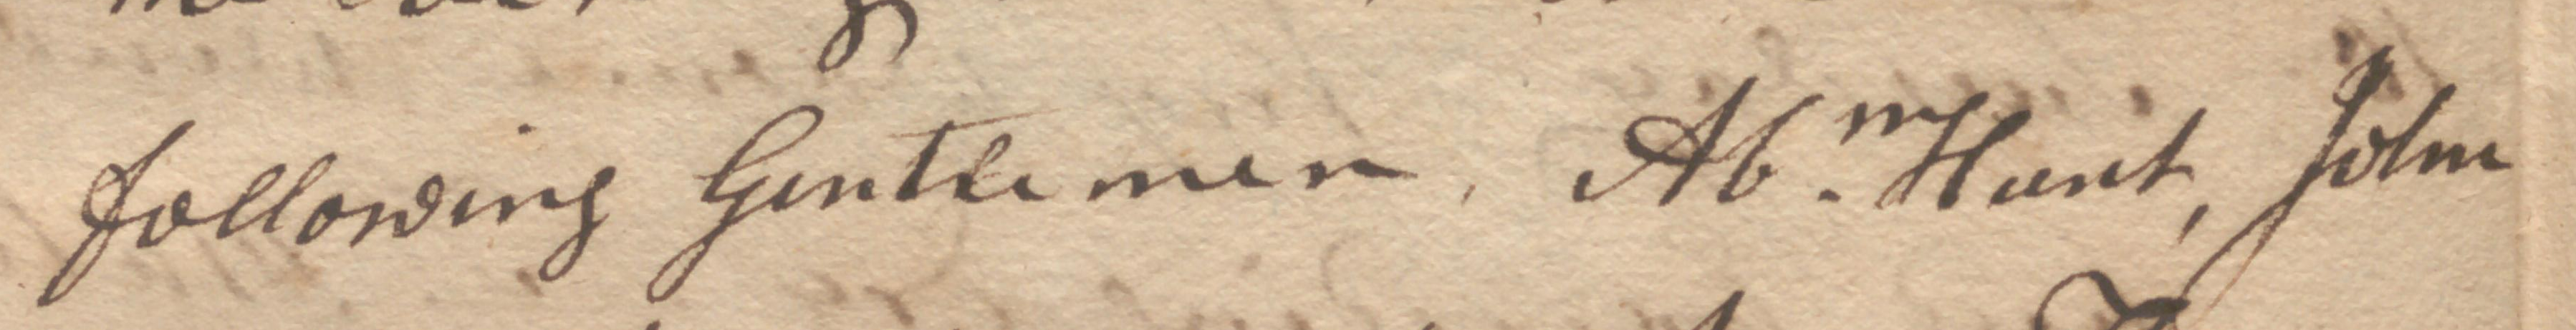following Gentlemen. Ab^m. Hunt John
